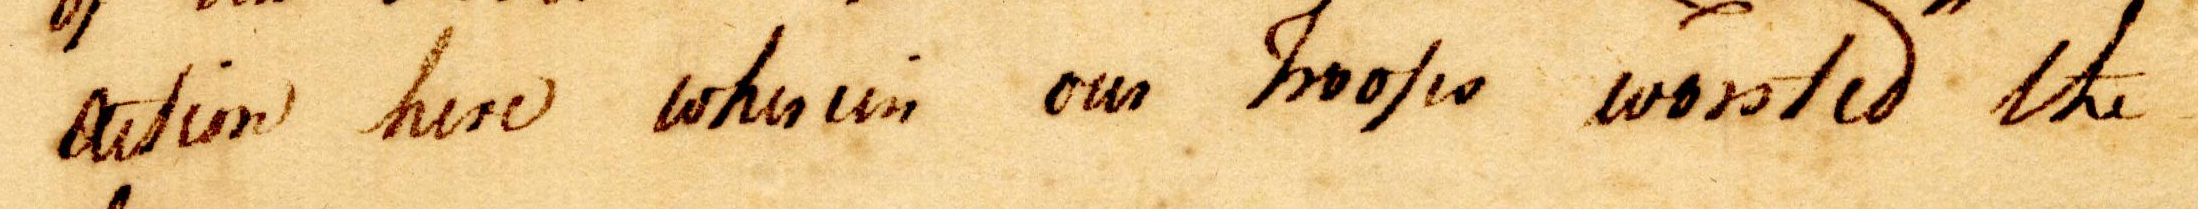action here wherein our Troops worsted the
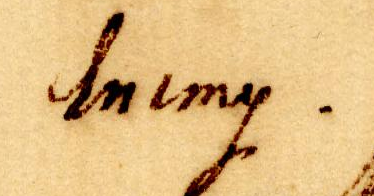Enemy.
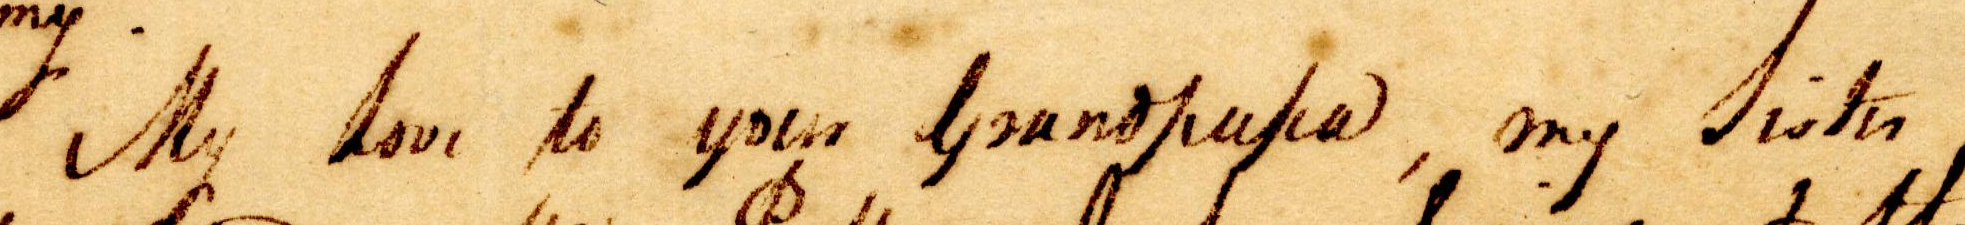My Love to your Grandpapa my Sister
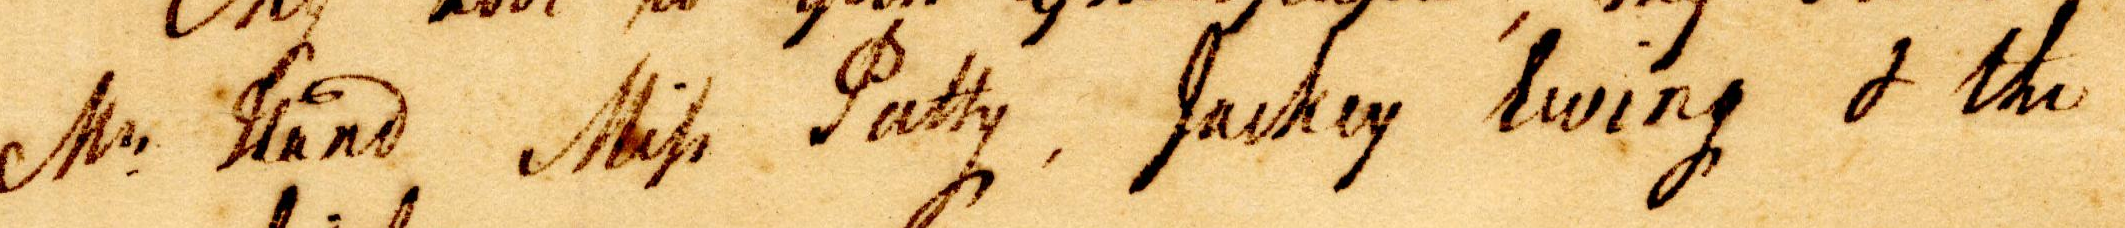M^r Hand Miss Patty, Jacky Ewing & the
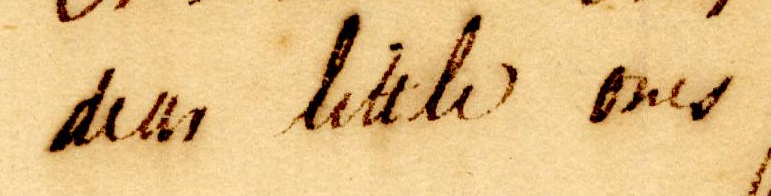dear little ones.
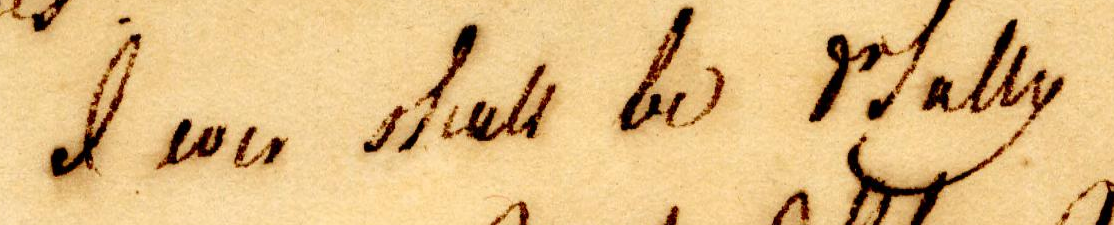I ever shall be d^r Sally
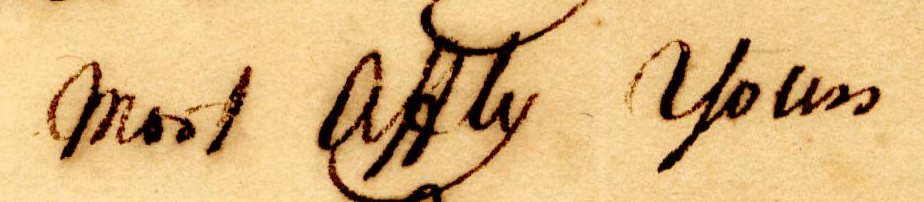Most Affly Yours
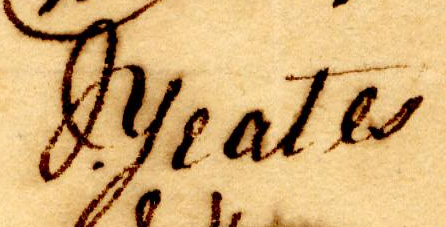J. Yeates
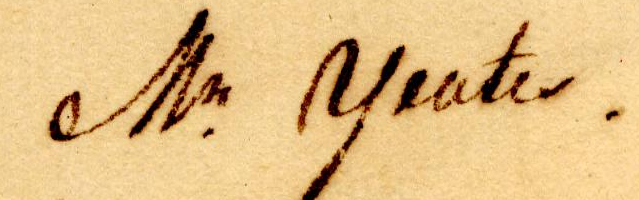M^r. Yeates
